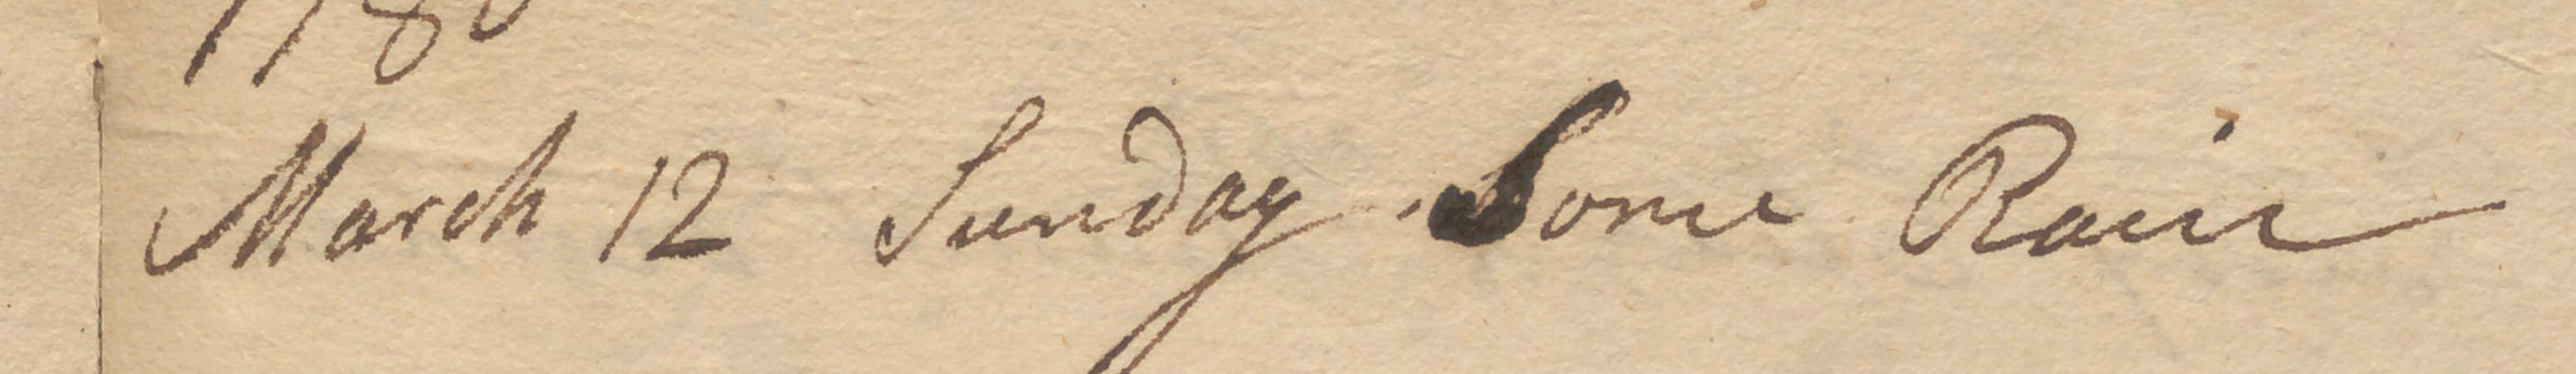March 12 Sunday Some Rain
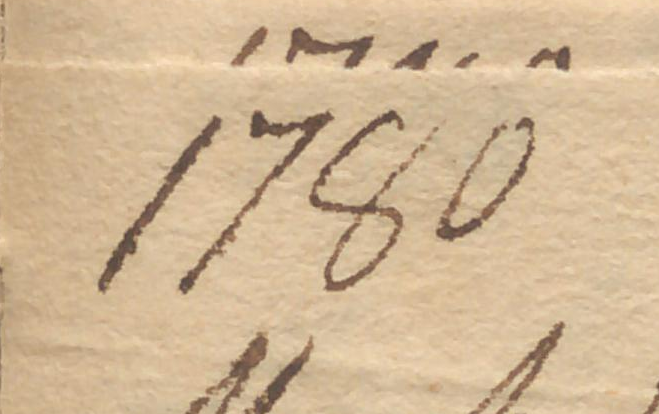1780
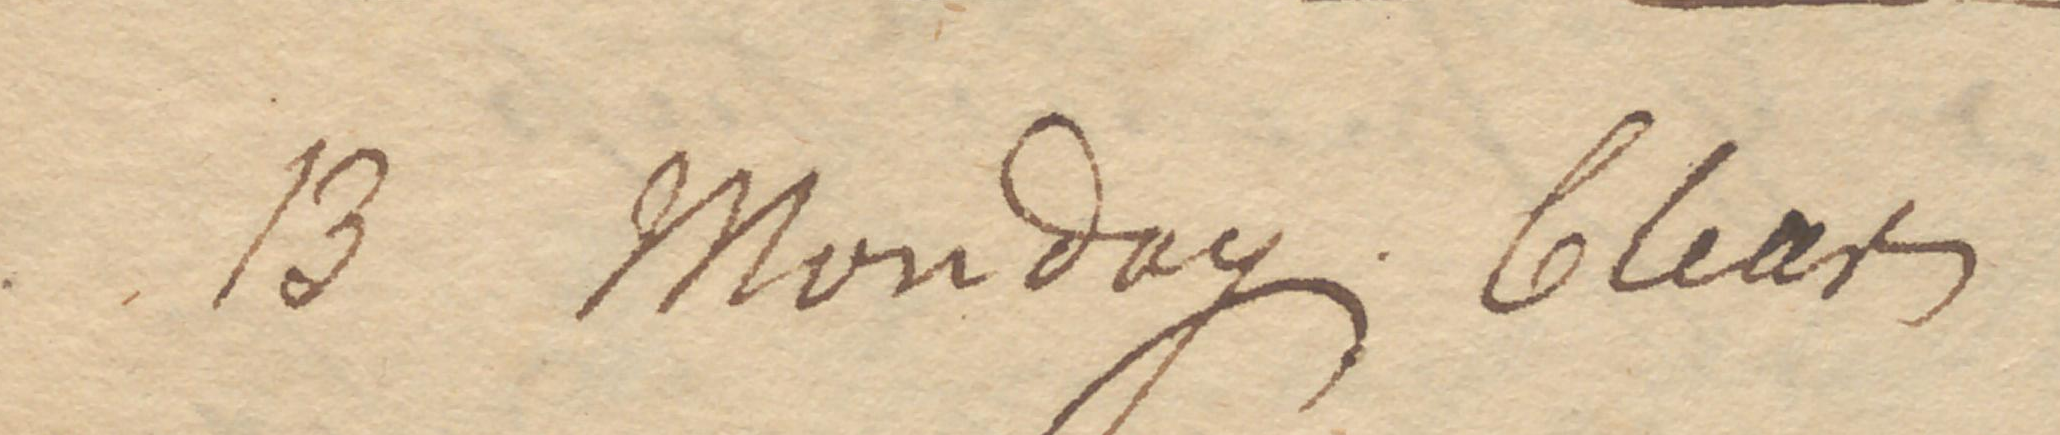13 Monday. Clear
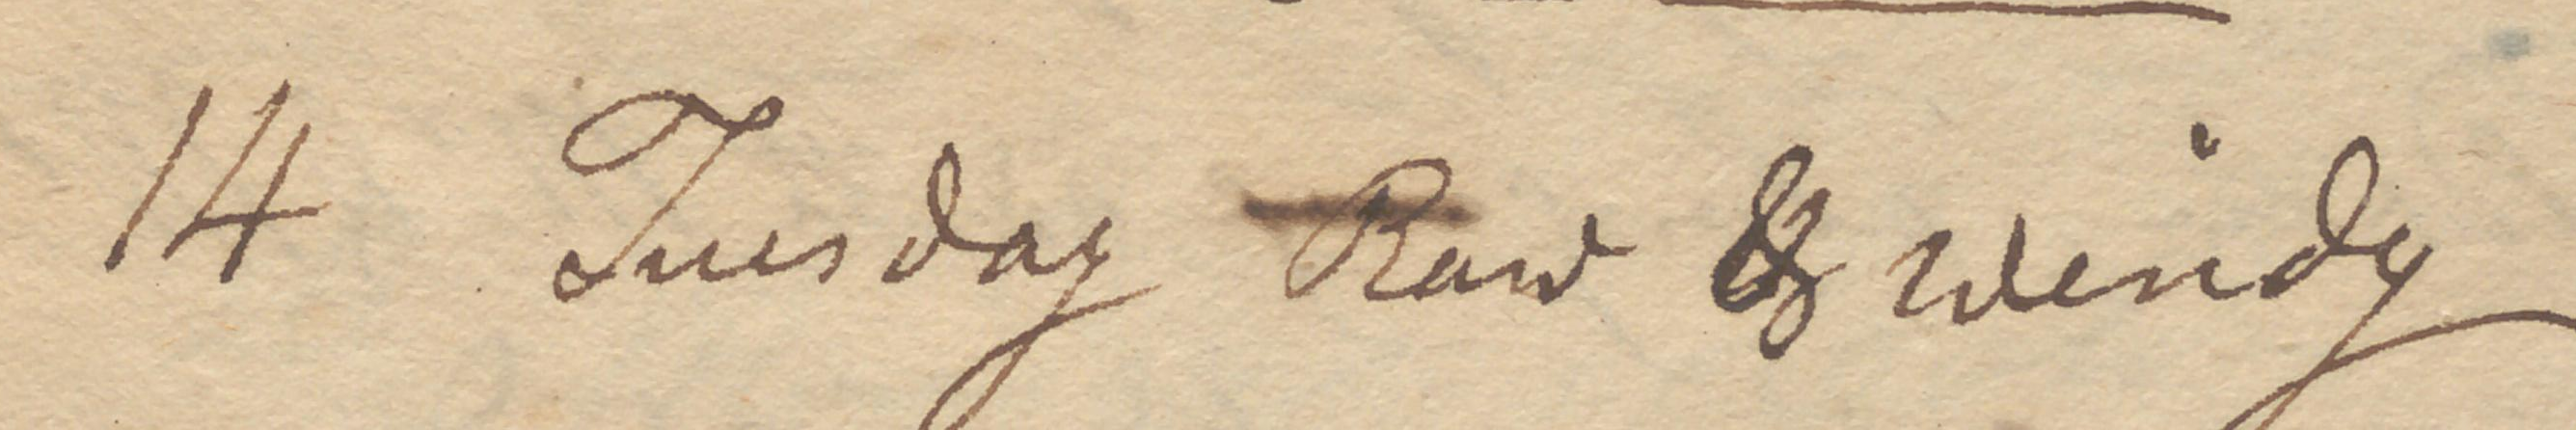14 Tuesday Raw & windy
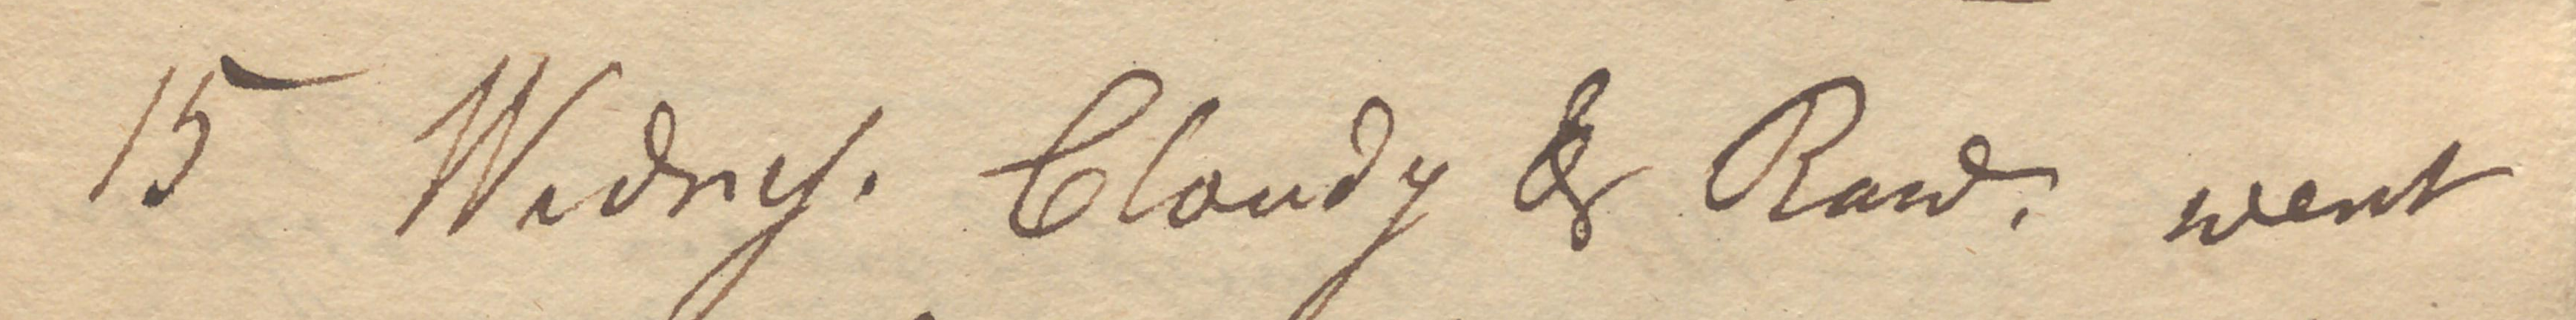15 Wednes. Cloudy & Raw. went
